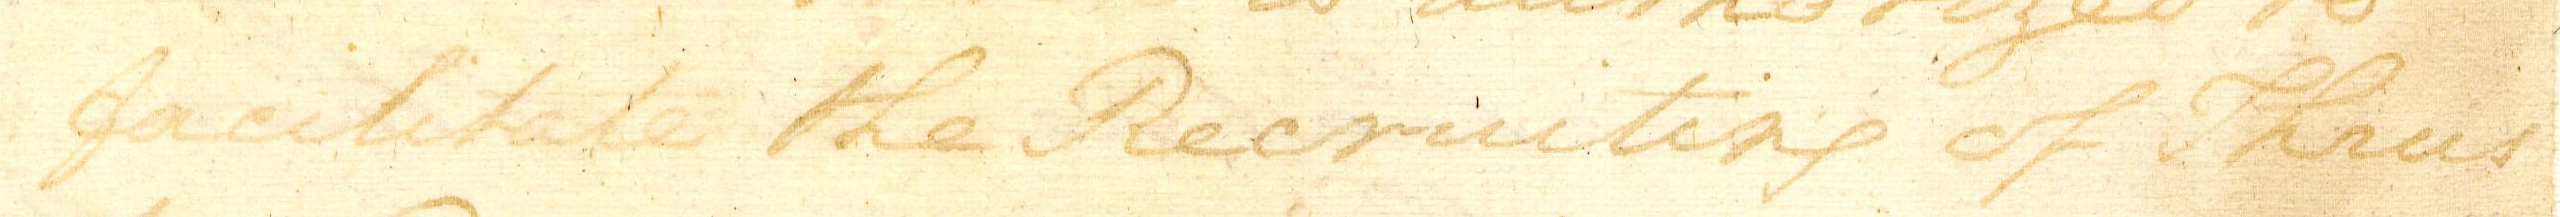facilitate the Recruiting of Thrus
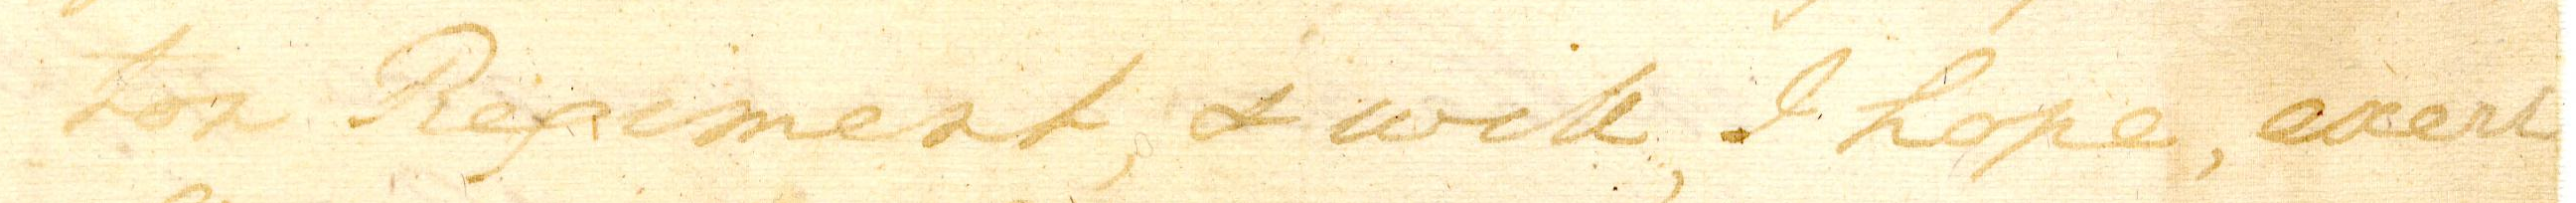ton Regiment & will I hope, exert
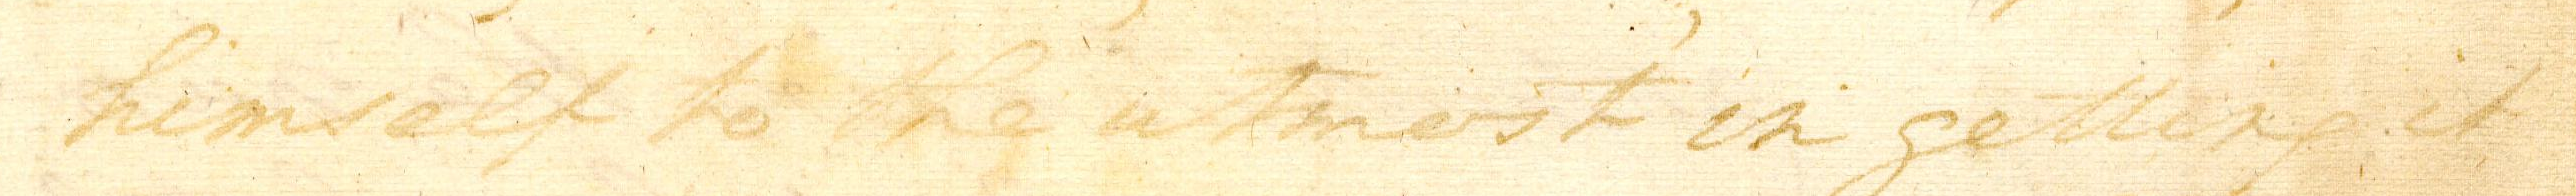himself to the utmost in getting it
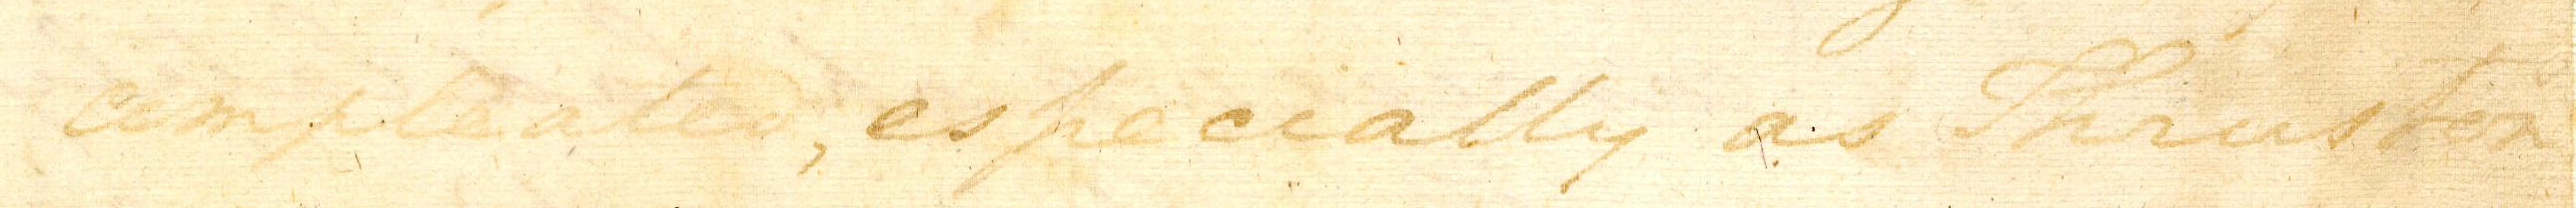compleated, especially as Thruston
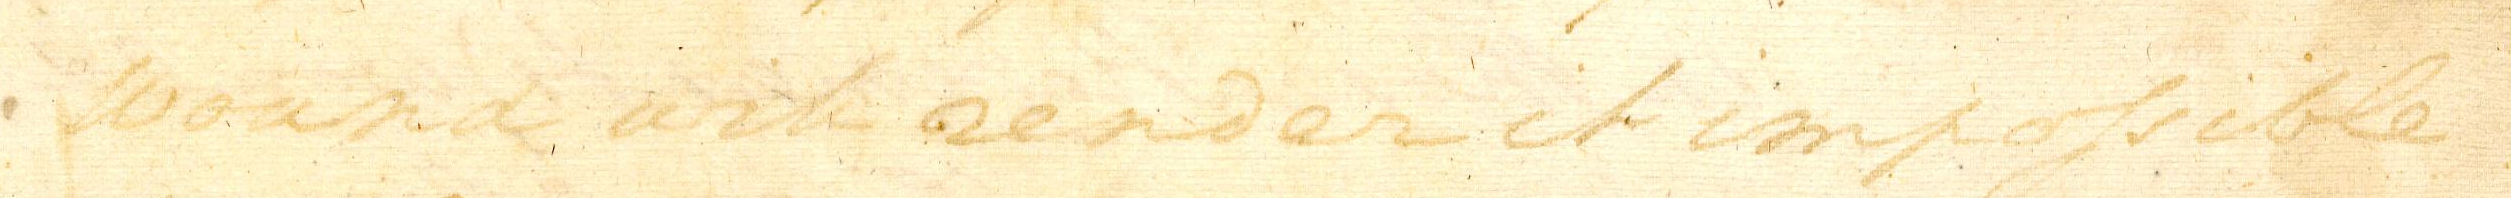wound will render it impossible
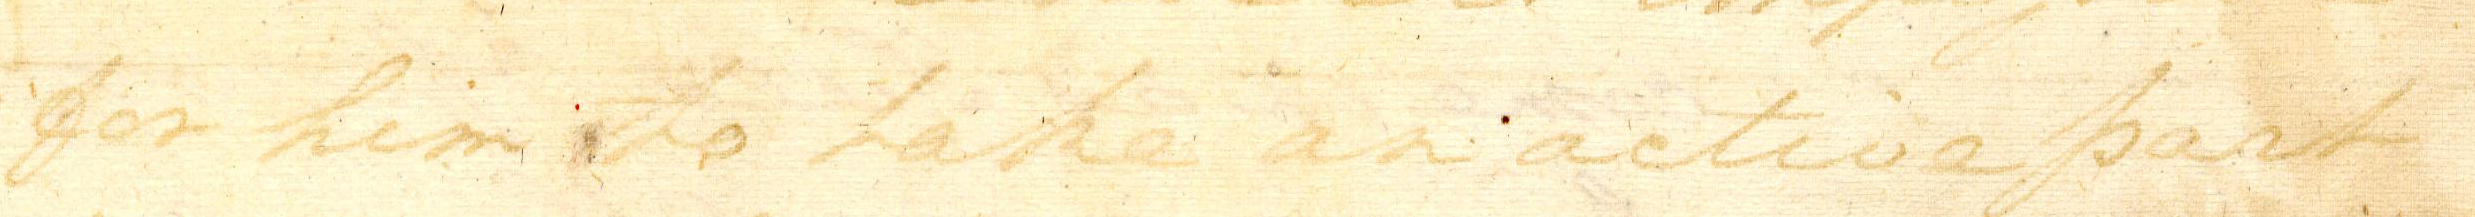for him to take an active part
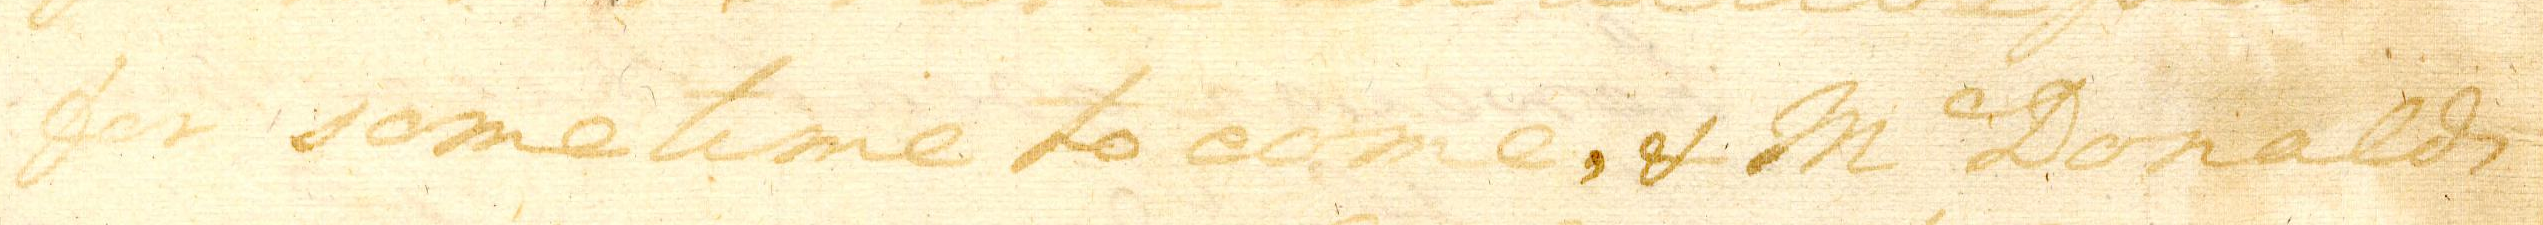for sometime to come, and M^cDonalds
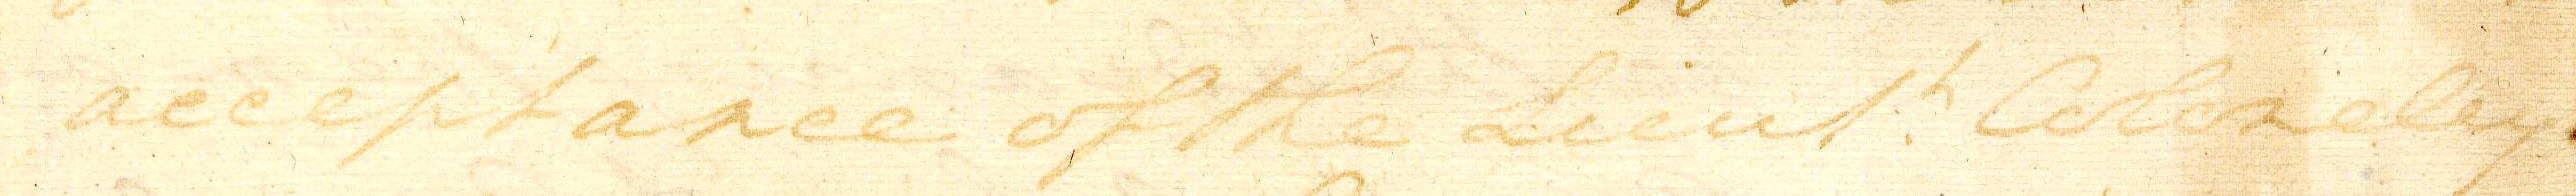acceptance of the Lieut^t. Coloneley
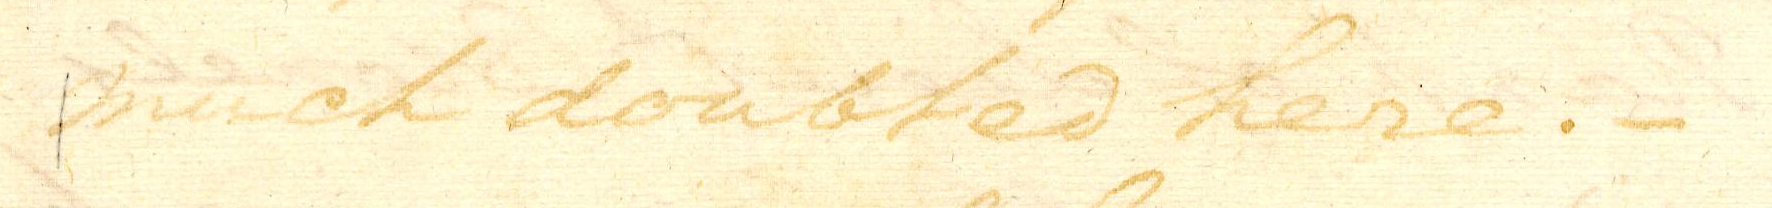much doubted here.-
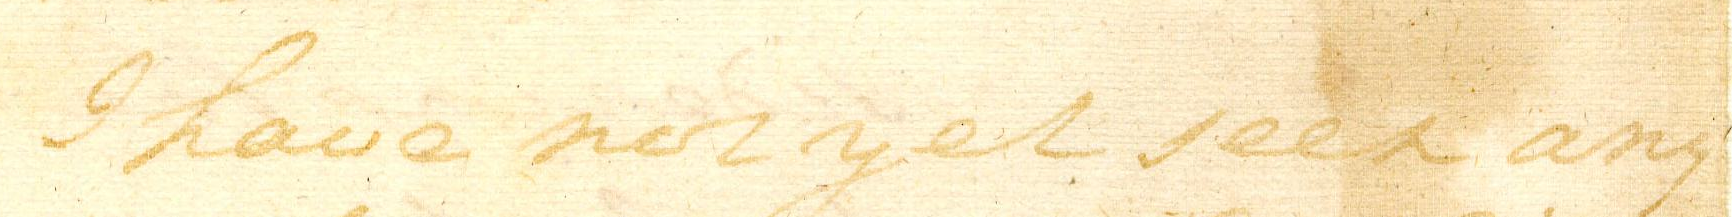I have not yet seen any
